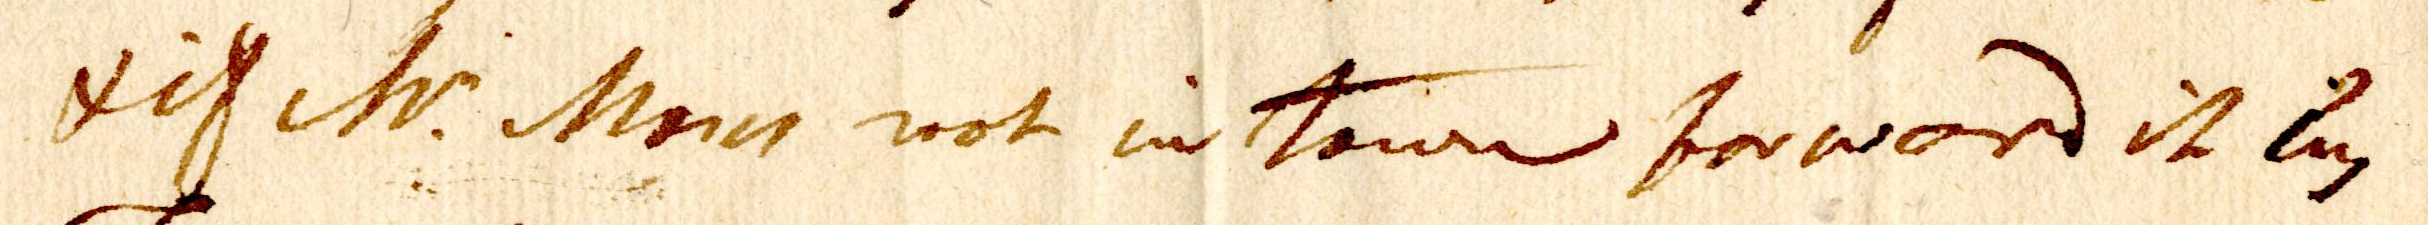& if M^r. Moses not in town forward it by
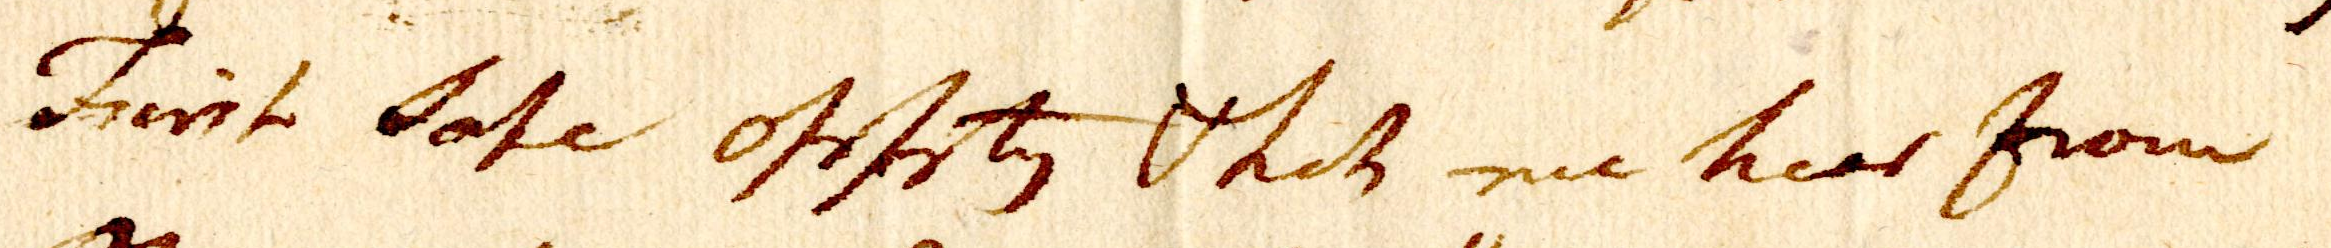first Safe opp^ty & let me hear from
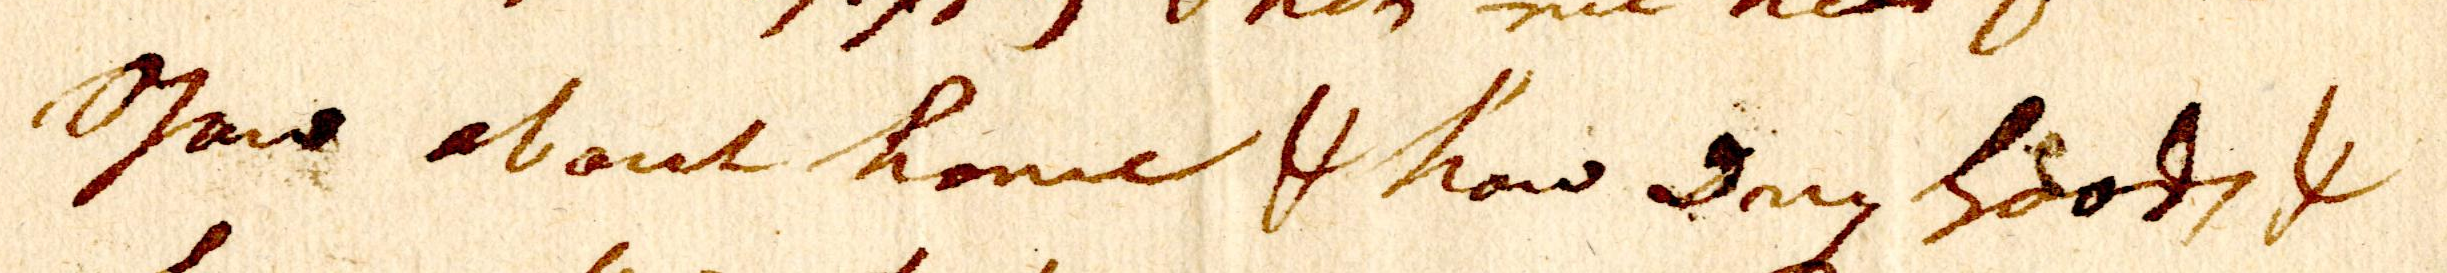you about home & how Dry goods &
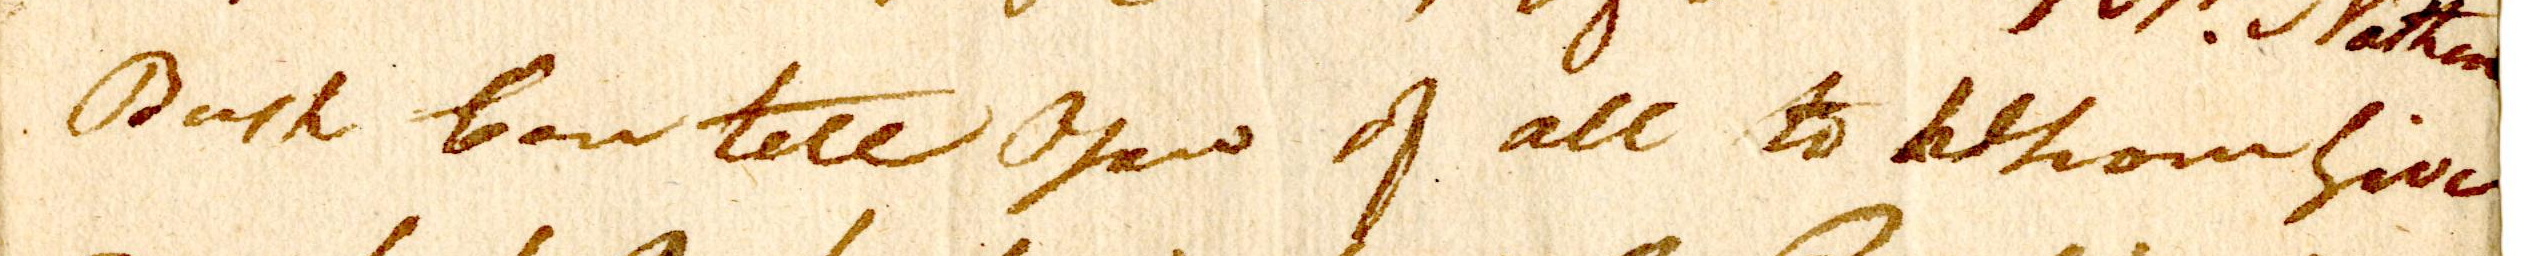Bush Can till You of all to Whom Give
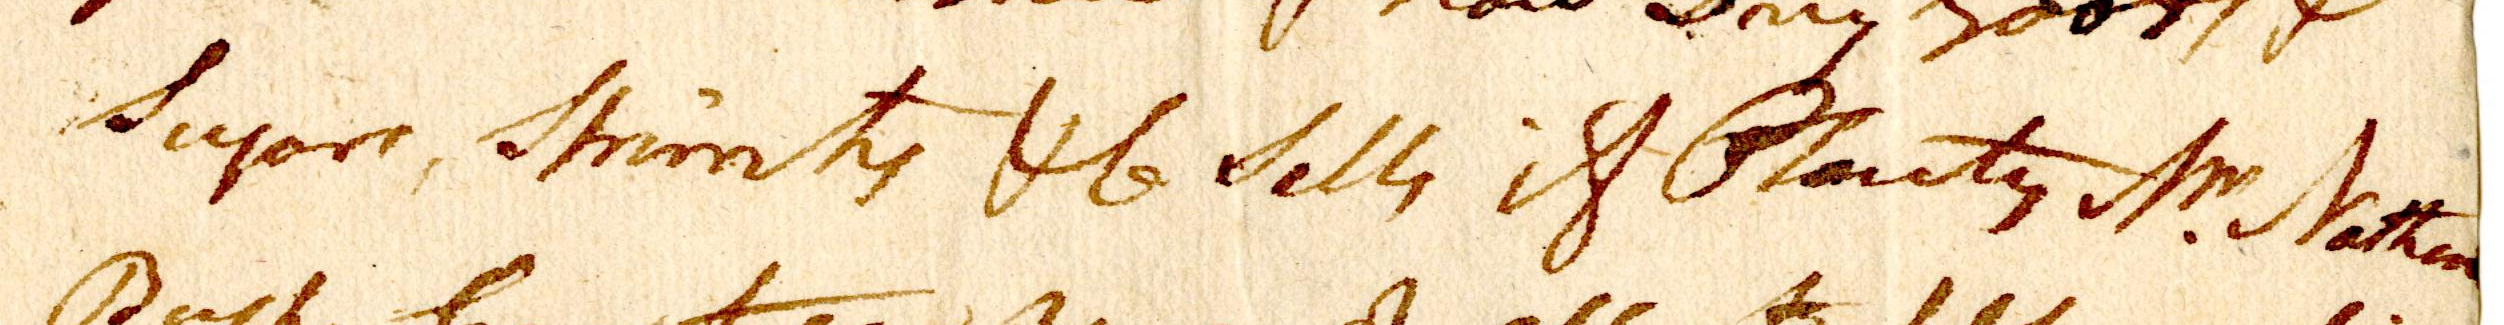Sugar, spirrits &C sells if plenty M^r Nathan
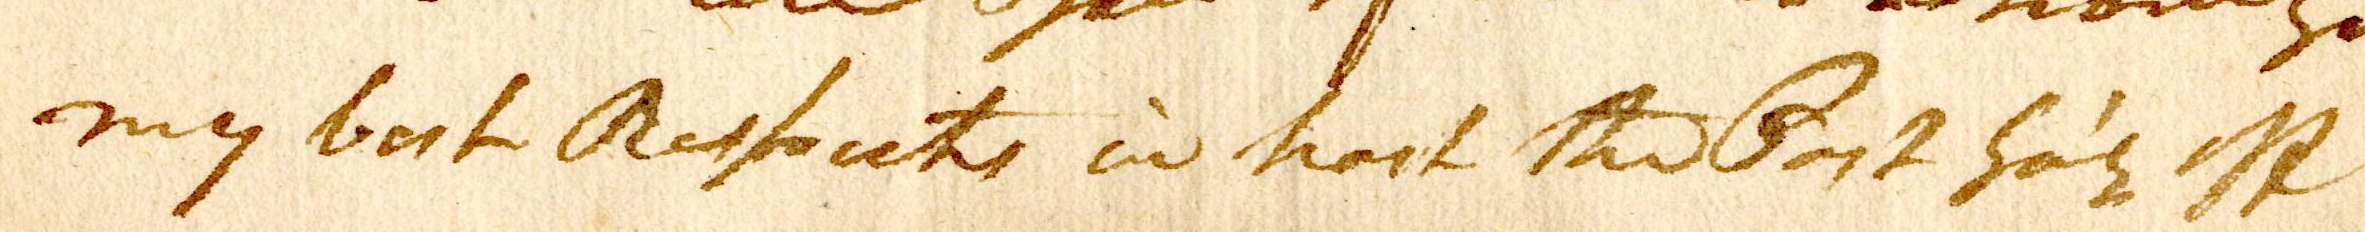my bet Respects in hast the Post go's off
